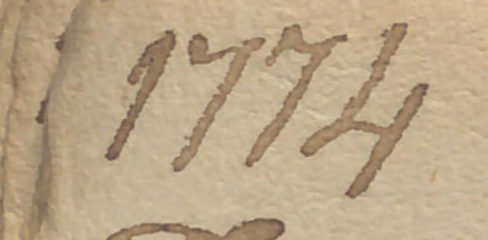1774
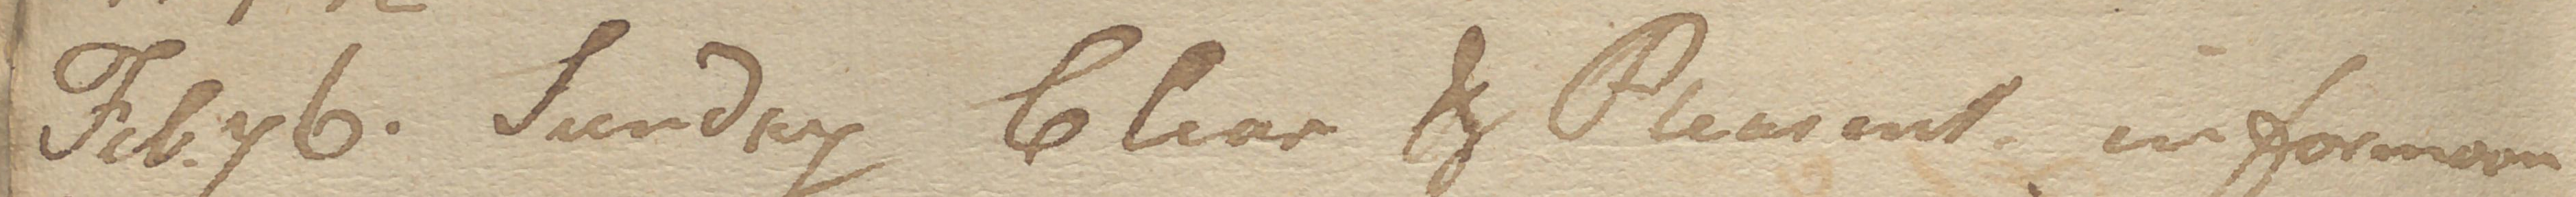Feb^y. 6^th. Sunday Clear & Pleasent in forenoon
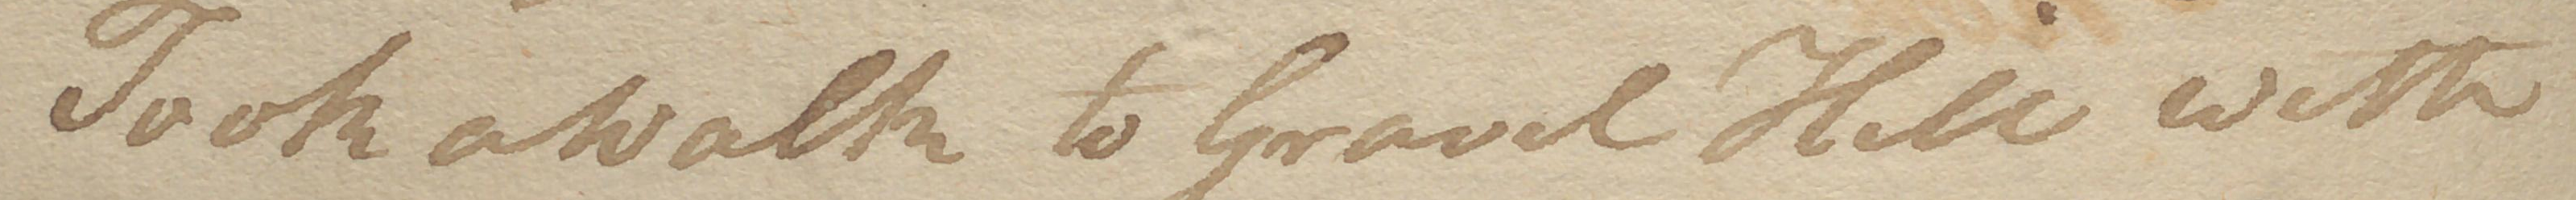Took a walk to Gravel Hill with
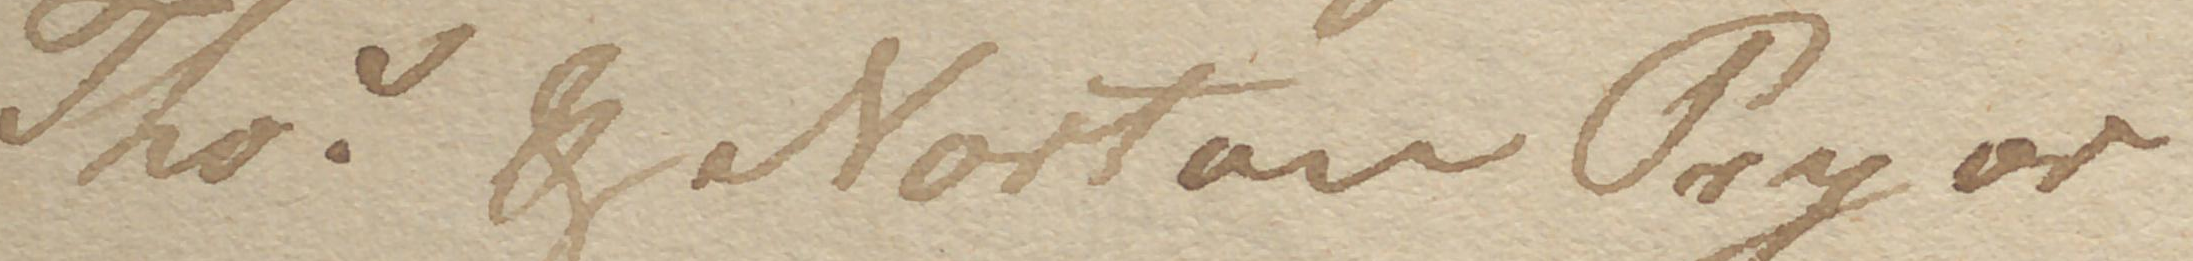Tho^s. & Nortan Pryor
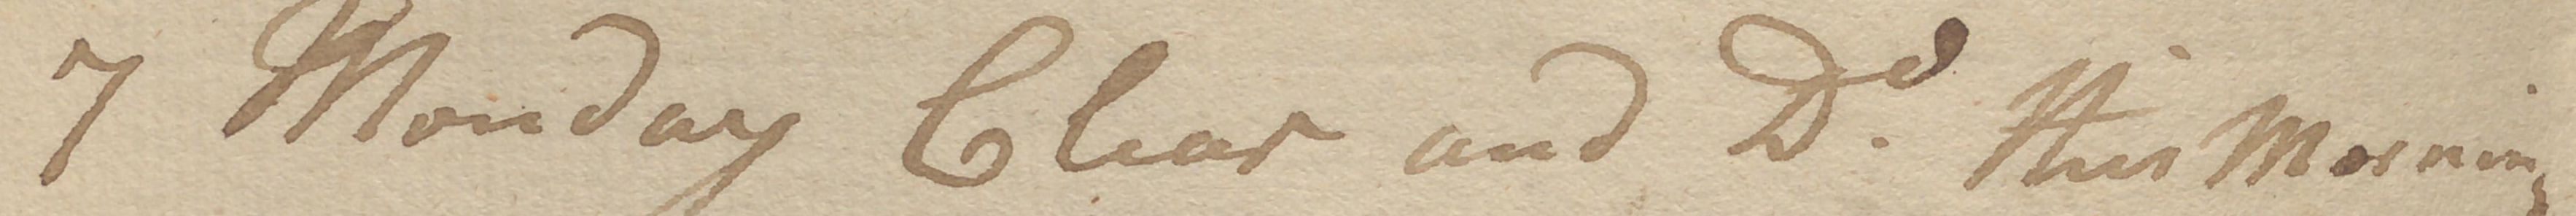7 Monday Clear and D^o. This Morning
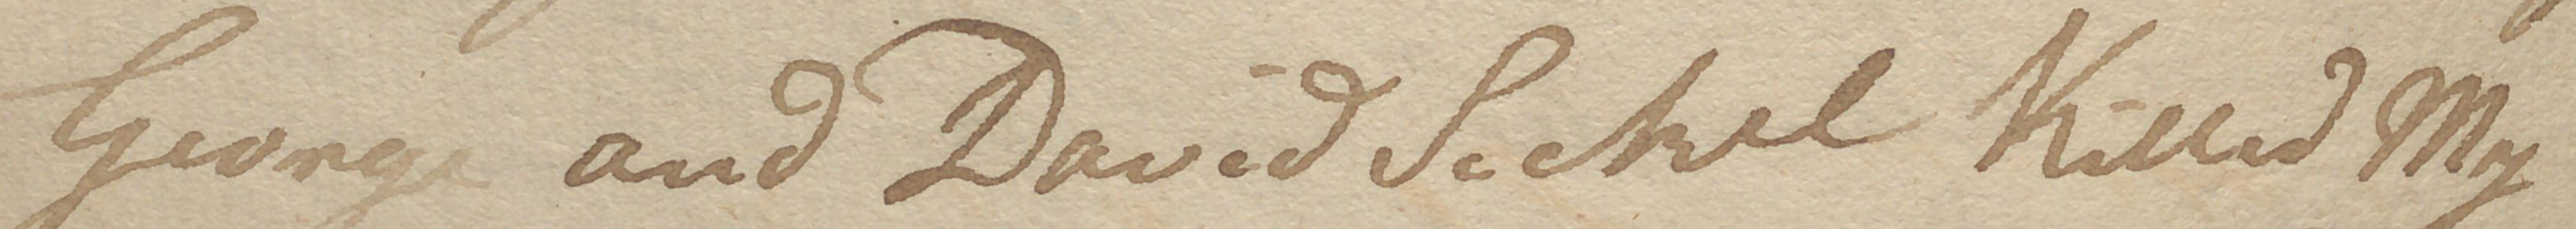George and David Seckel Killed My
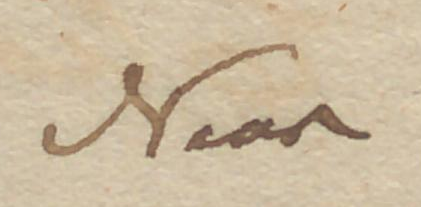Near
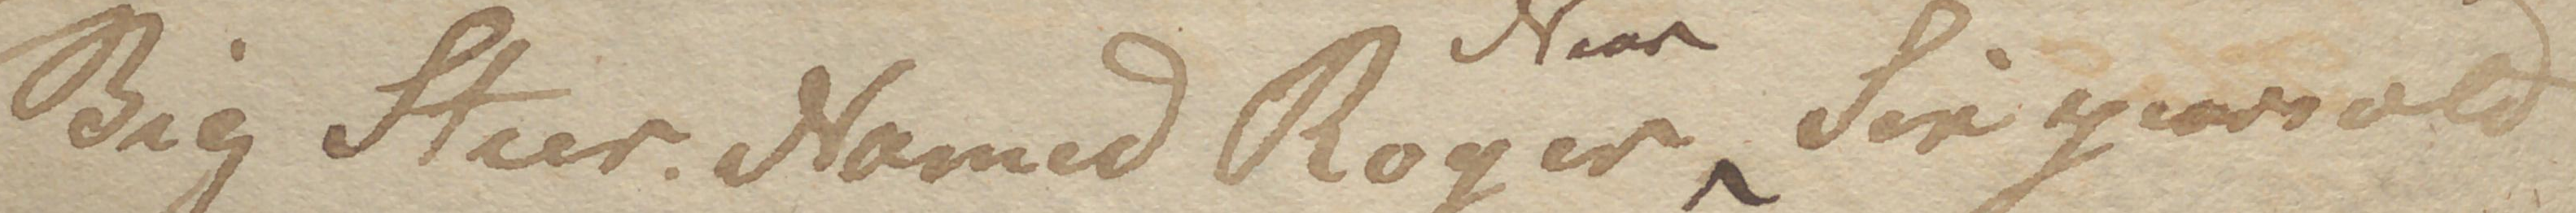Big Steer Named Roger ^ Six yearso
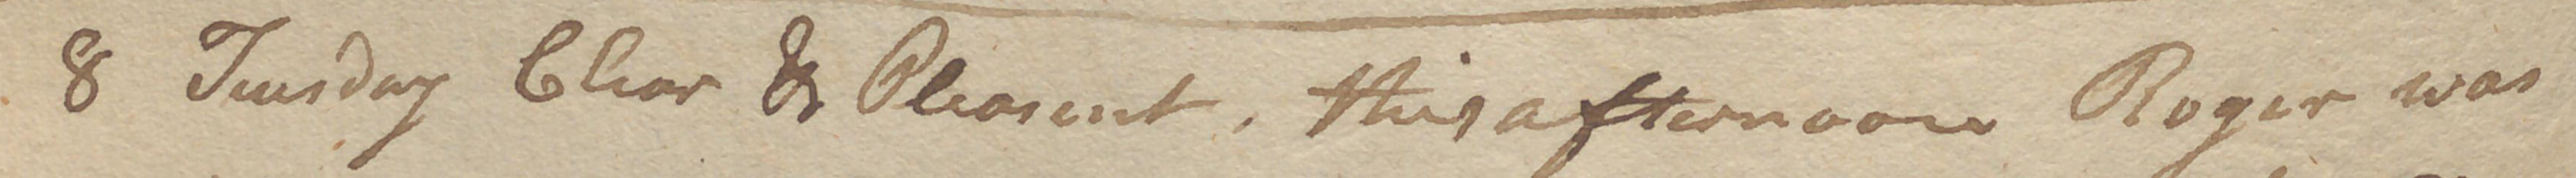8 Tuesday Clear & Pleasent, this afternoon Roger was
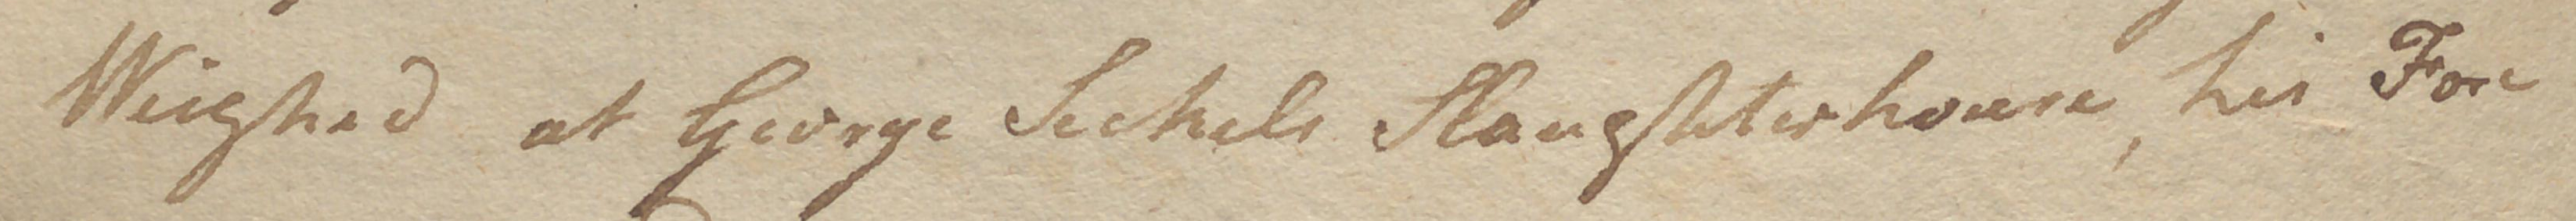Weighed at George Seckels Slaughterhouse, his Fore
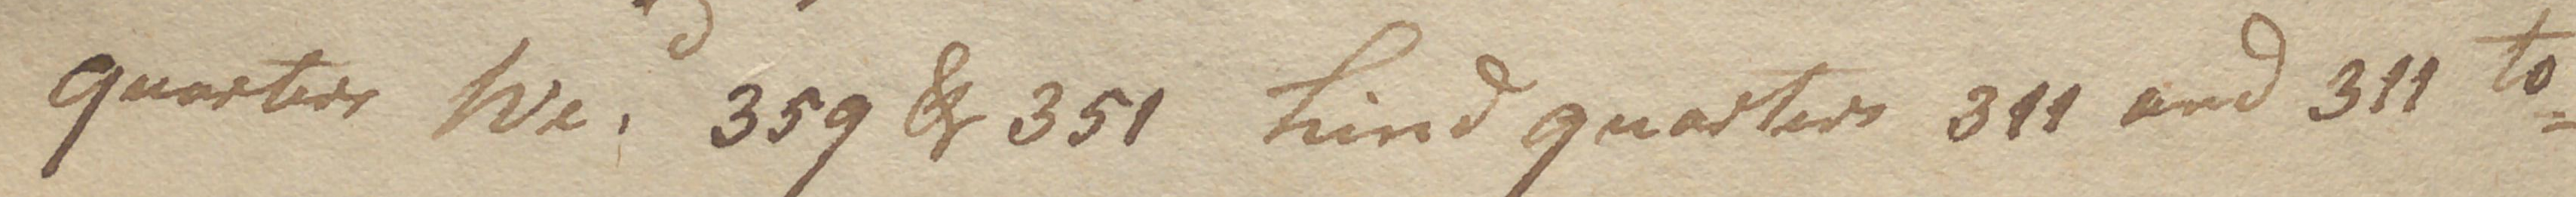quarter We^d. 359 & 351 hind quarters 311 and 311 to-
